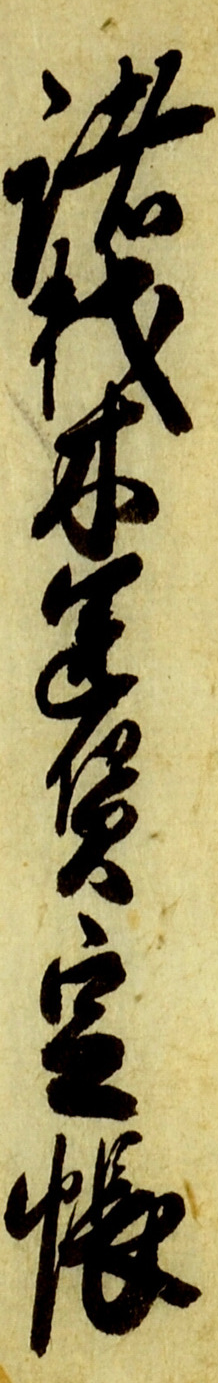諸材木運賃定帳

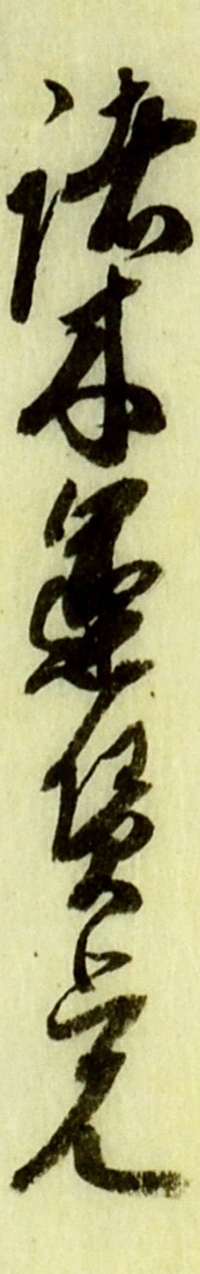諸木運賃覚
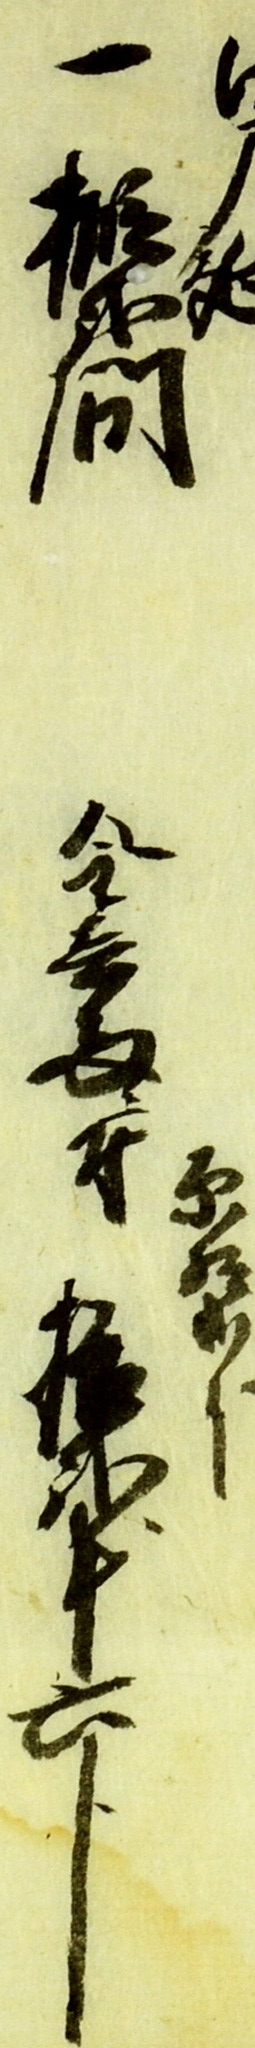一縦弐間金壱両ニ付拾弐本六分
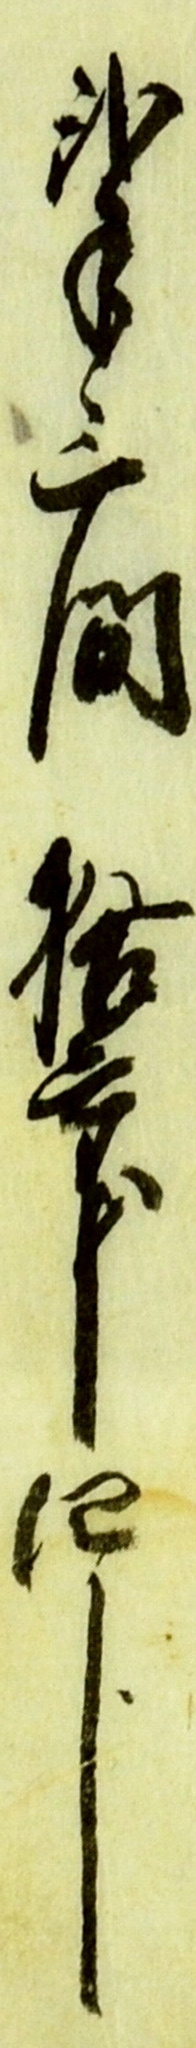弐手三間拾壱本四分
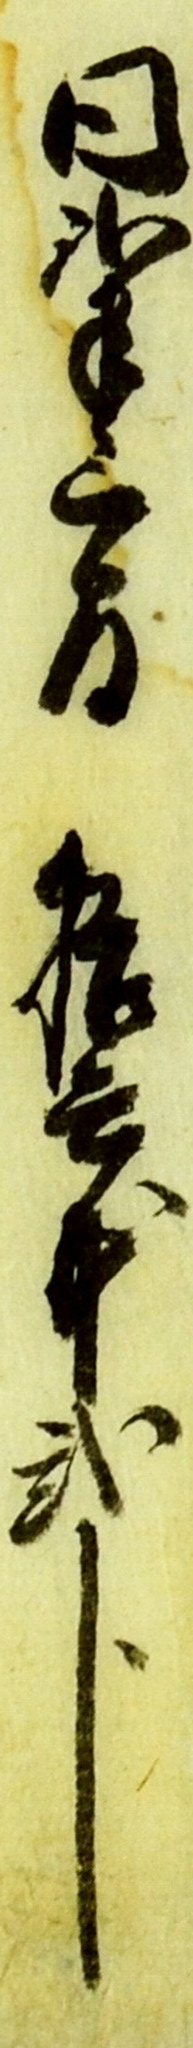弐手三間拾壱本四分
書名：諸材木運賃定帳
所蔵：伊那市立高遠町図書館・合同会社AMANE
